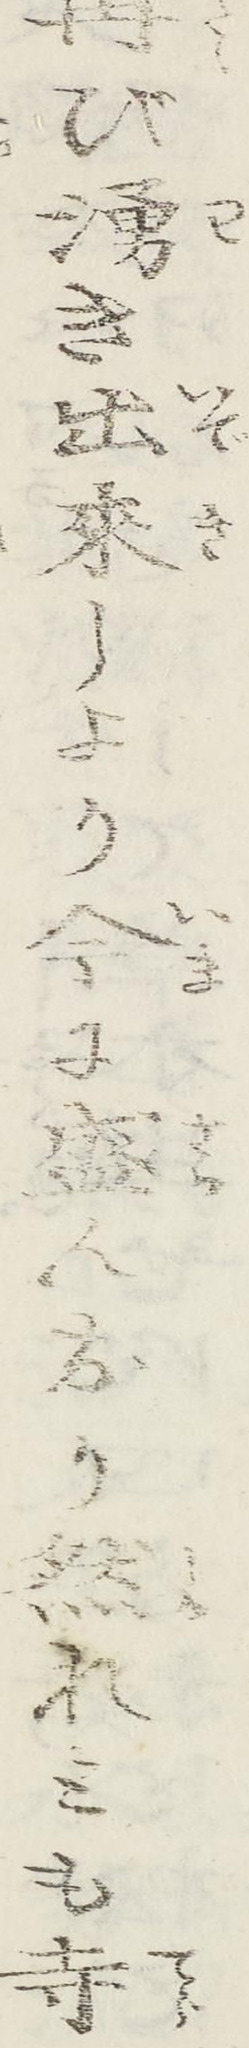再び湧き出来しより今に盛んなり然れとも寺
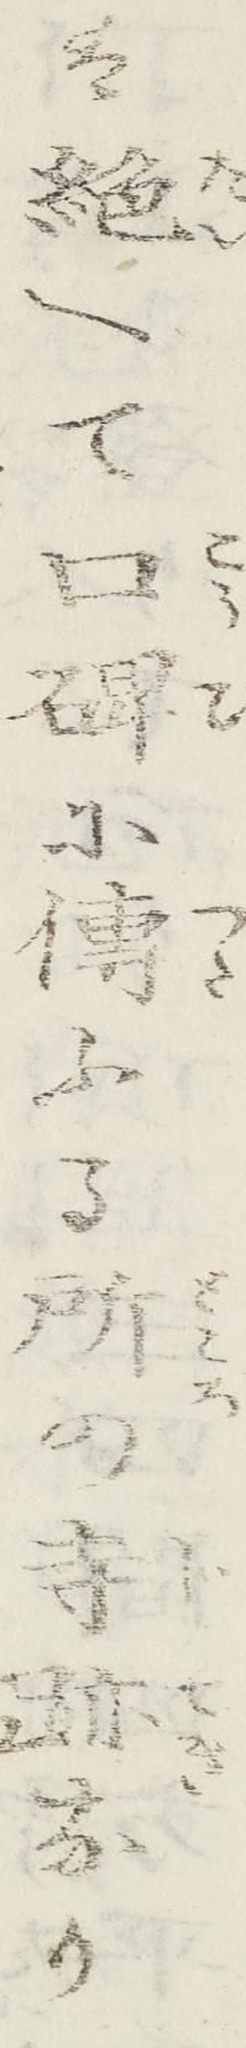は絶へて口碑に伝ふる所の寺跡なり
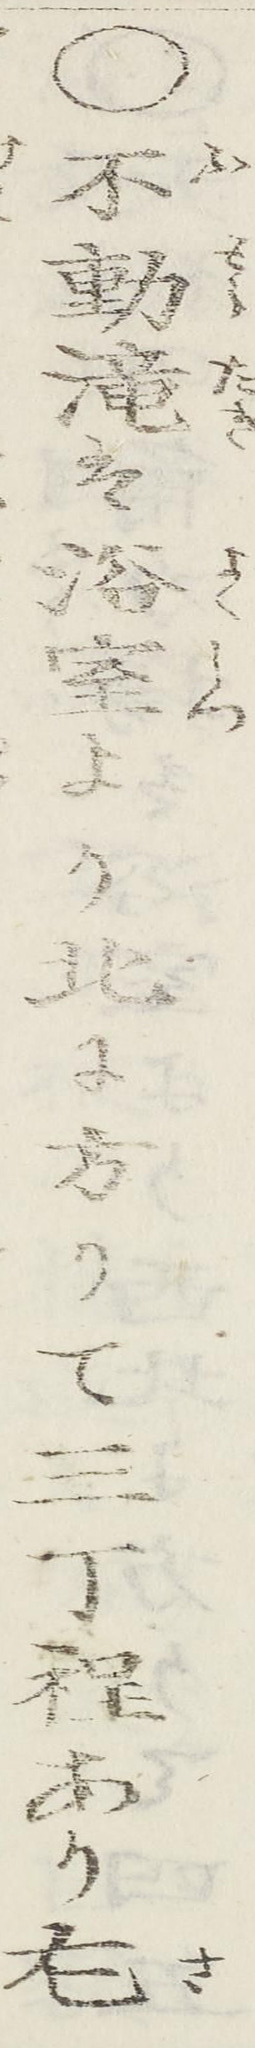○不動滝は浴室より北に方りて三丁程あり左
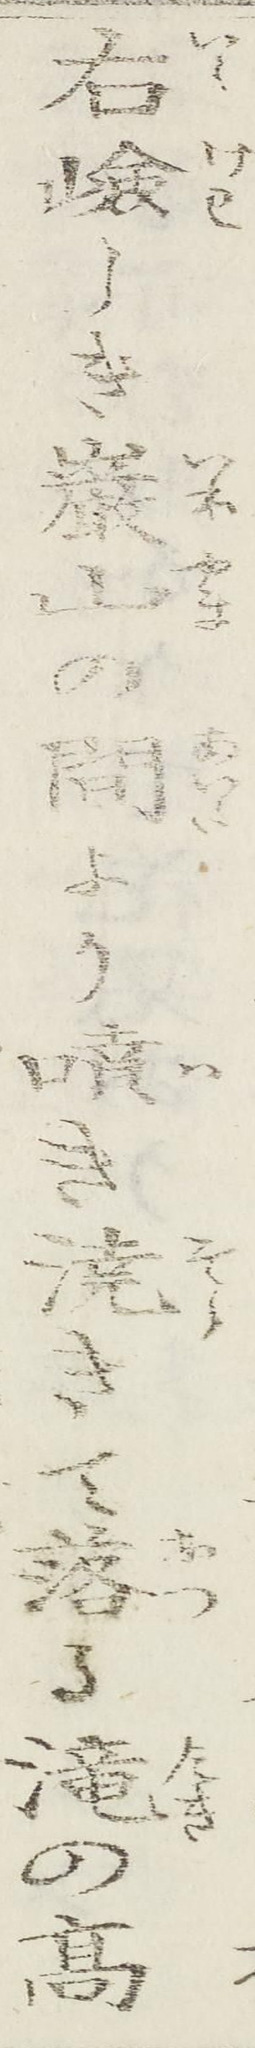右嶮しき巖山の間より噴き澆きて落る滝の高
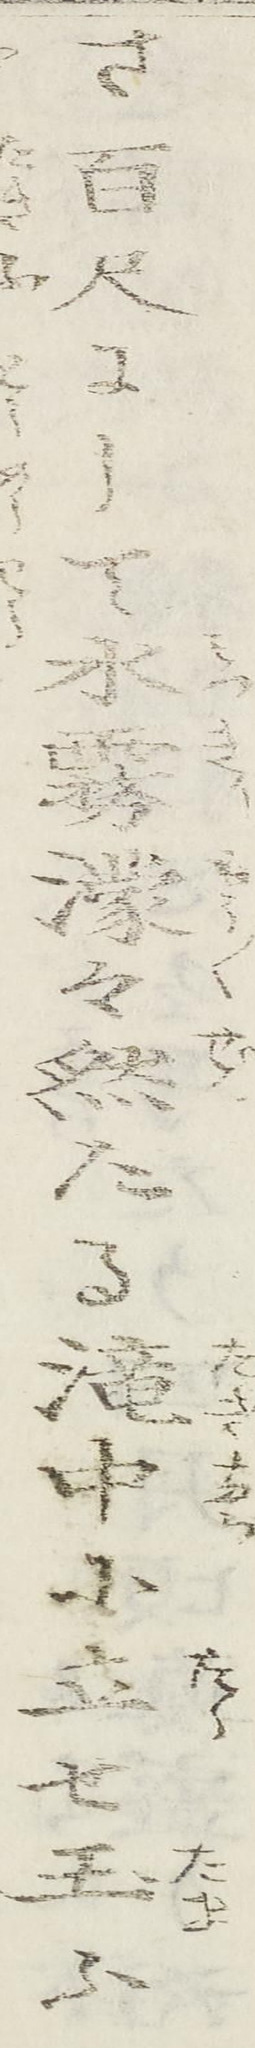さ百尺にして水霧濛々然たる滝中に立せ玉ふ
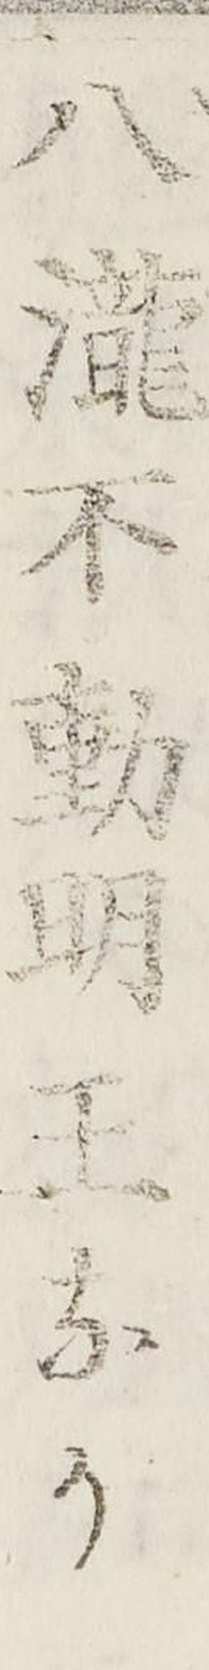八瀧不動明王なり
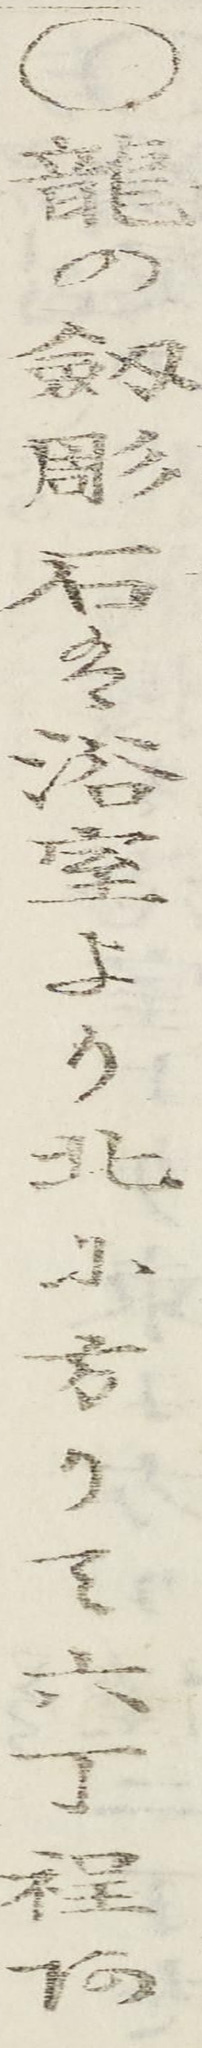○龍の剣彫石は浴室より北に方りて六丁程あ
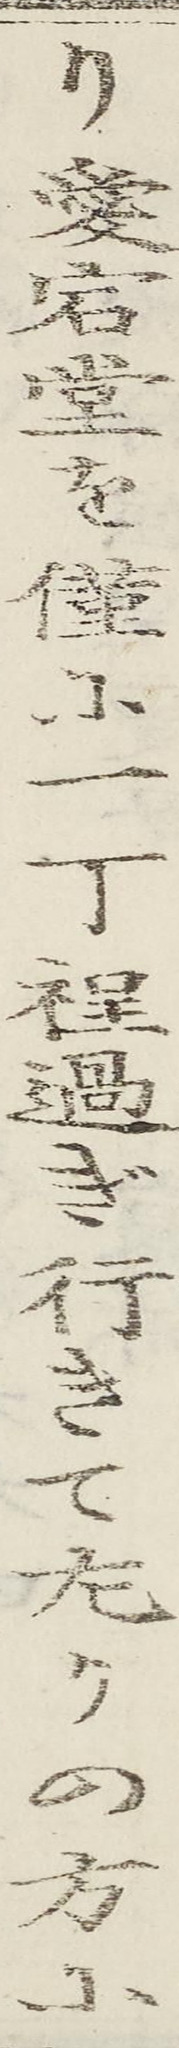り愛宕堂を僅に一丁程過ぎ行きて左りの方に
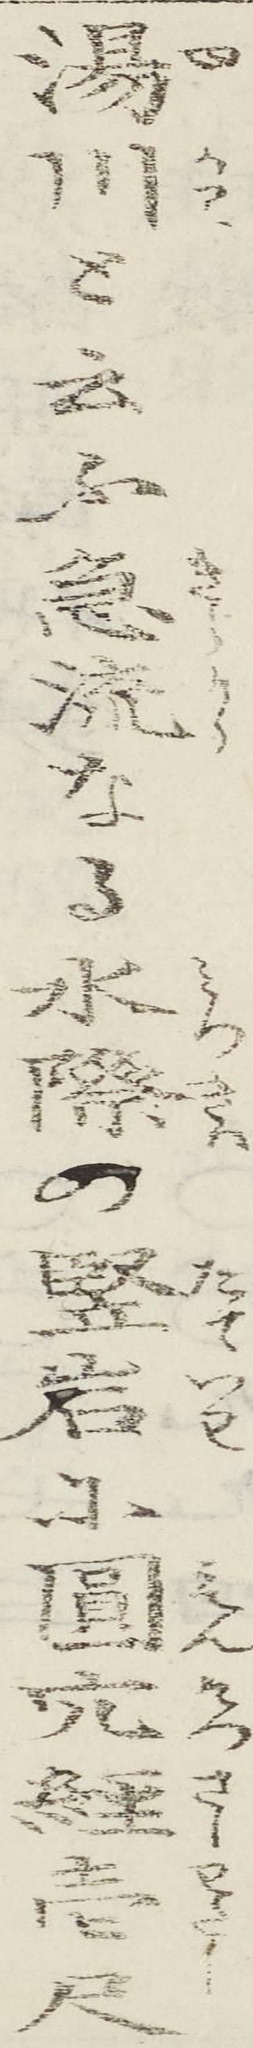湯川と云ふ急流なる水際の竪岩に円穴経壱尺
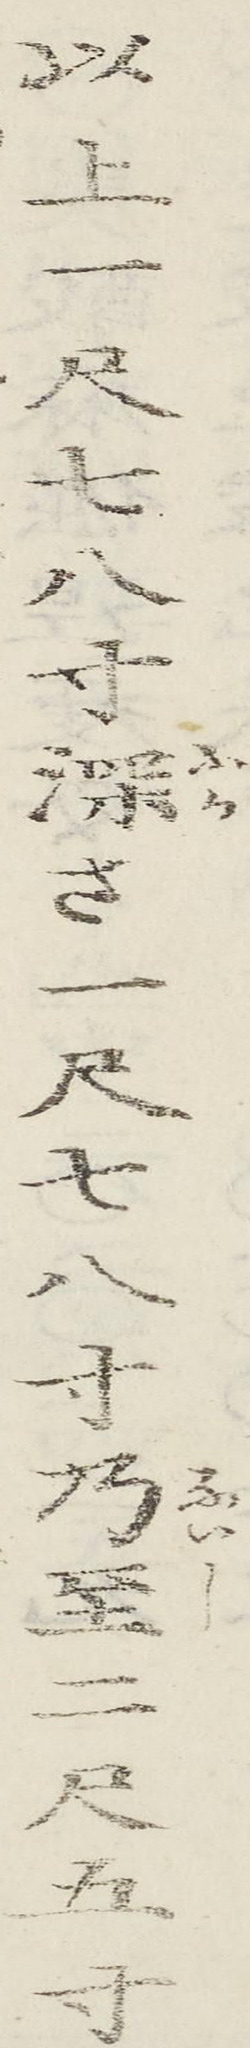以上一尺七八寸深さ一尺七八寸乃至二尺五寸
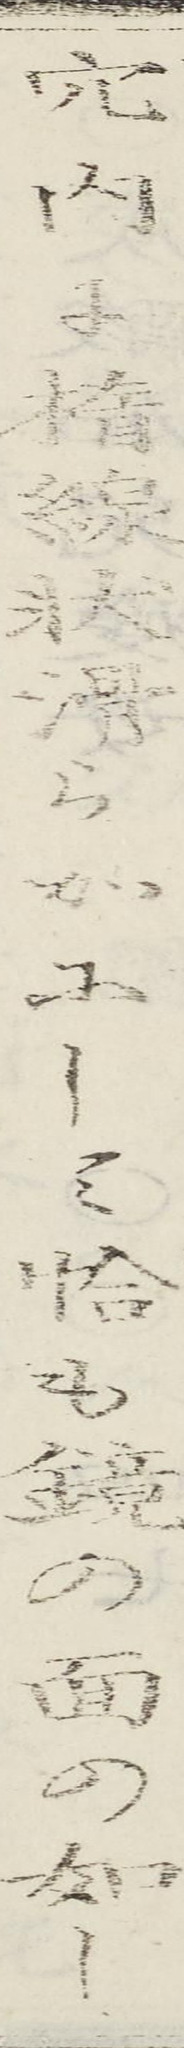穴内に楕線状滑らかにして恰も鏡の面の如し
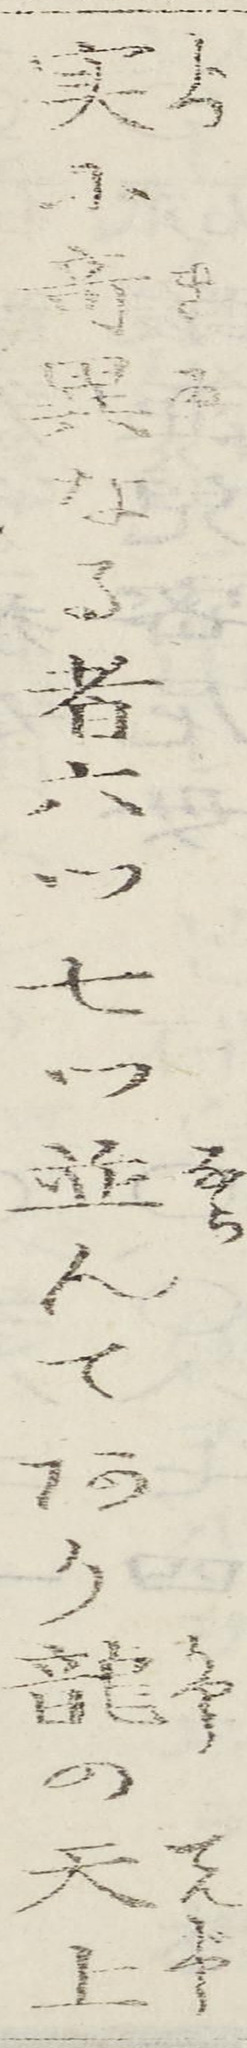実に奇異なる者六ッ七ッ並んてあり龍の天上
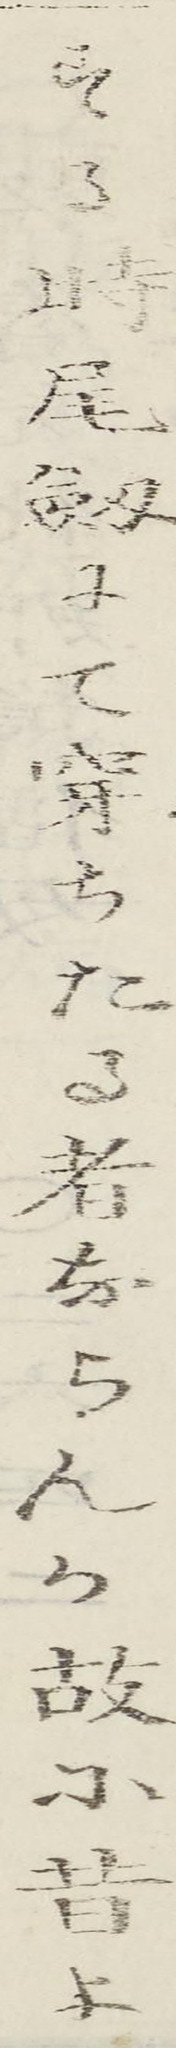する時尾剣にて穿ちたる者ならんか故に昔よ
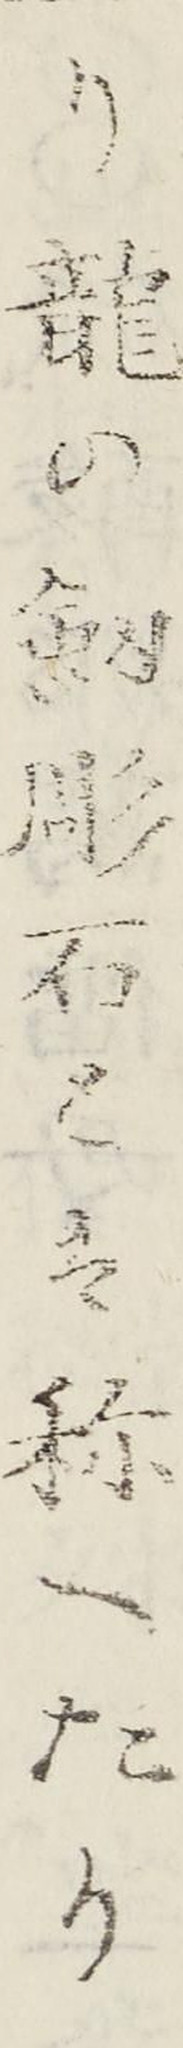り龍の剣彫石とは称へたり
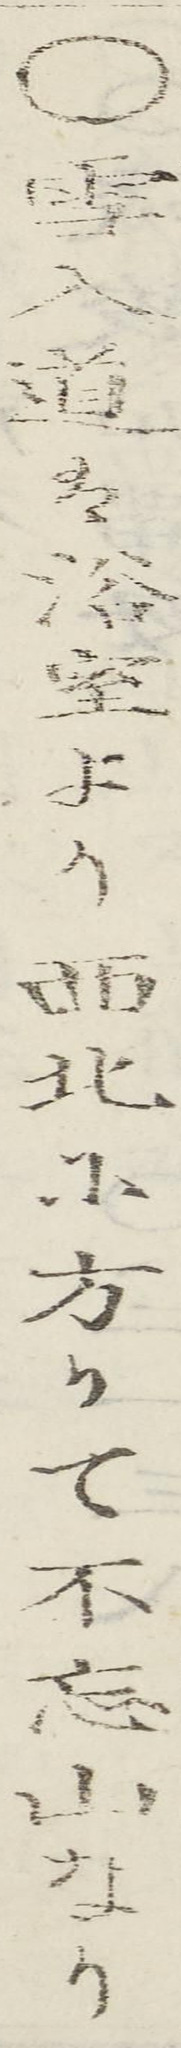○雪入道は浴室より西北に方りて不忘山なり
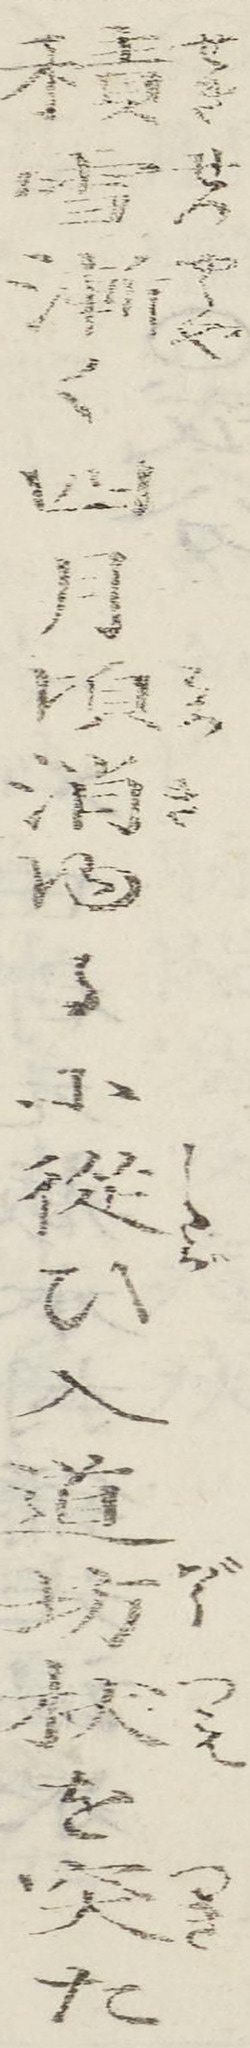積雪漸く四月頃消ゆるに従ひ入道坊杖を突た
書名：鎌先温泉由來記
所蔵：東京大学地震研究所図書室 Earthquake Research Institute Library, The University of Tokyo, JAPAN
